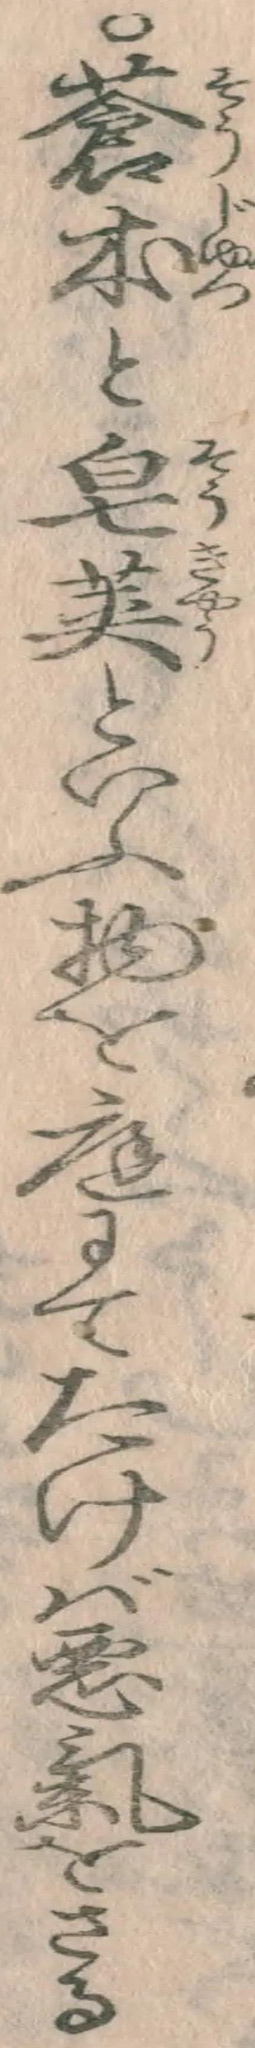◦蒼朮と皂莢といふ物を庭にてたけば悪気をさる
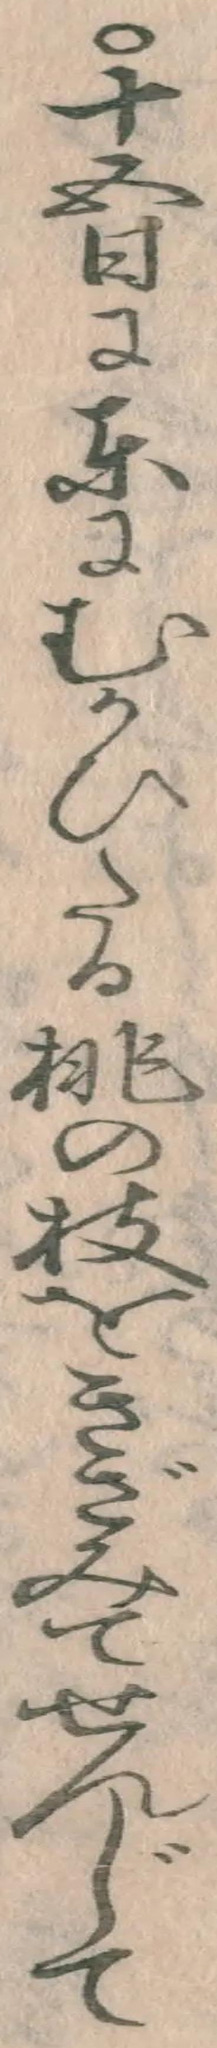◦十五日に東にむかひたる桃の枝をきざみてせんじて
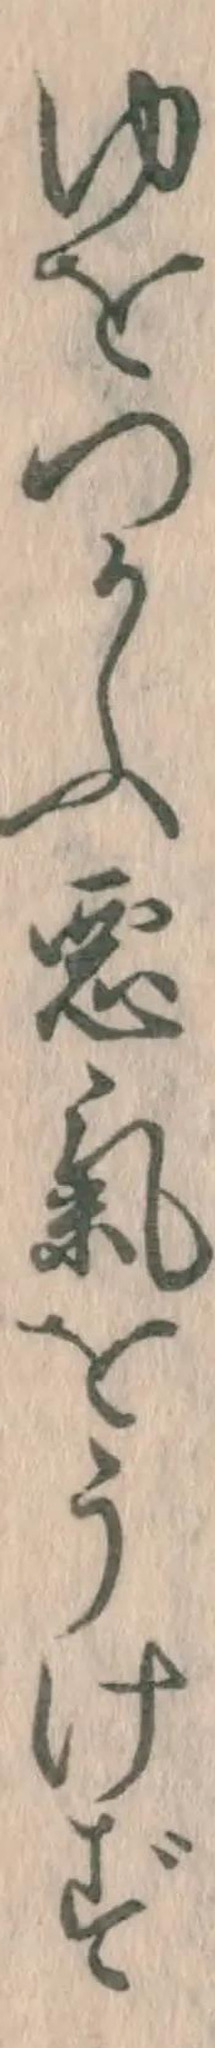ゆをつかふ悪気をうけず
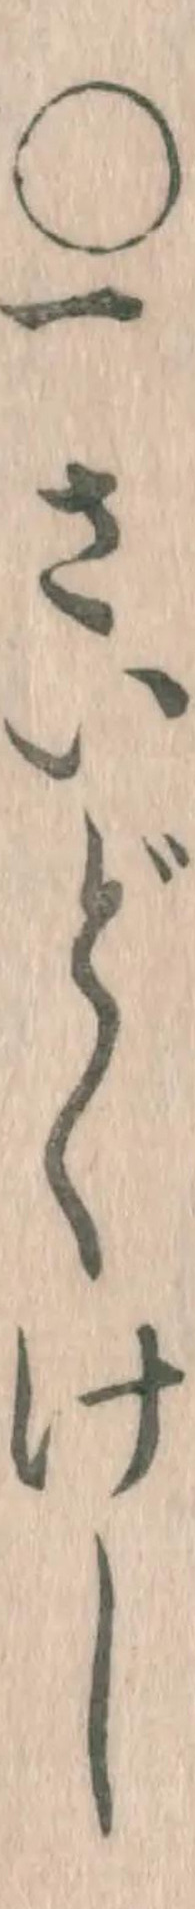◯一さいどくけし
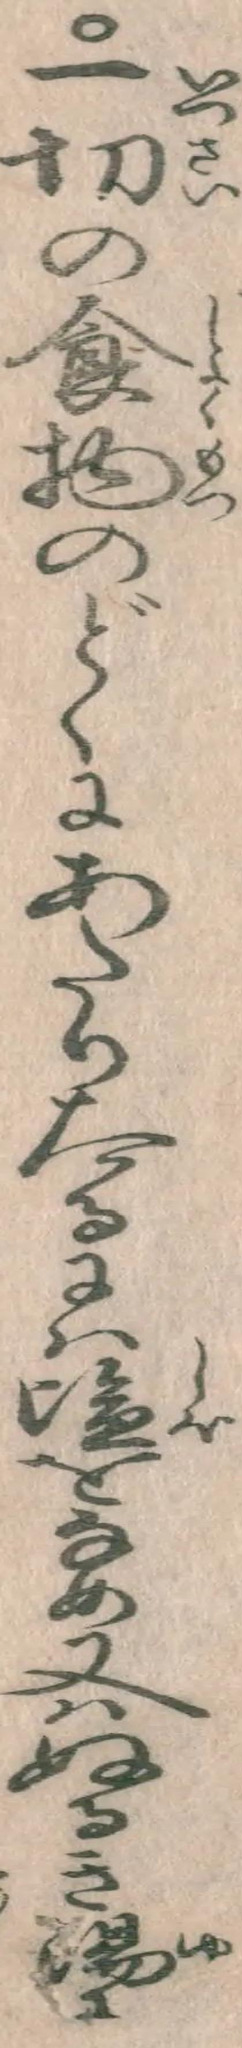◦一切の食物のどくにあたりたるには塩をなめ又はぬるき湯に
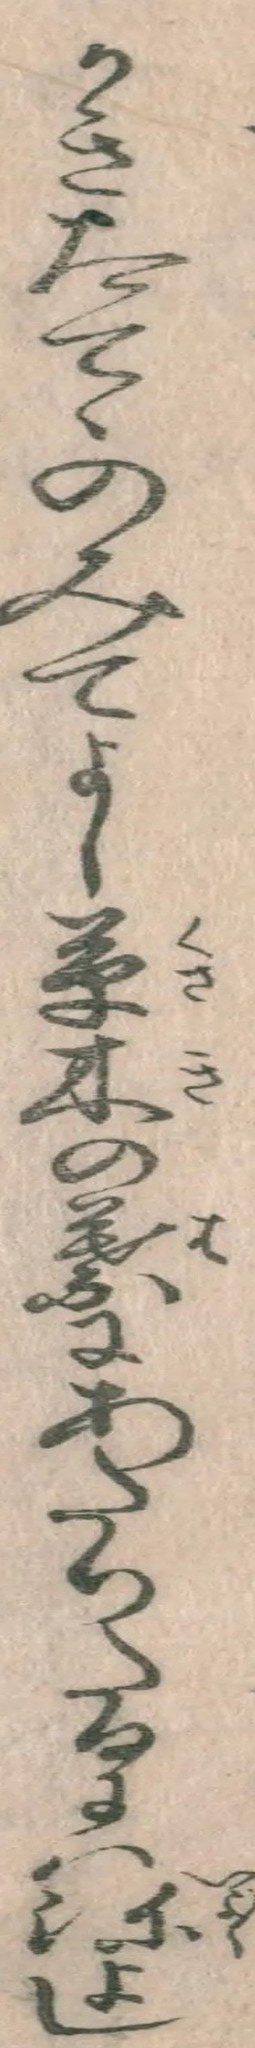かきたてゝのみてよし草木の葉にあたりたるには弥よし
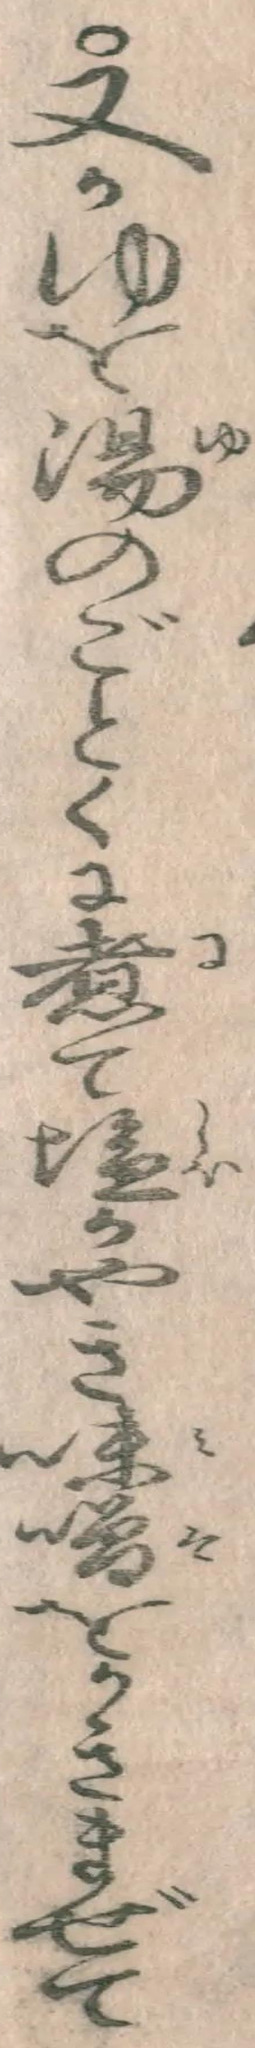◦又かゆを湯のごとくに煮て塩かやき味噌をかきまぜて
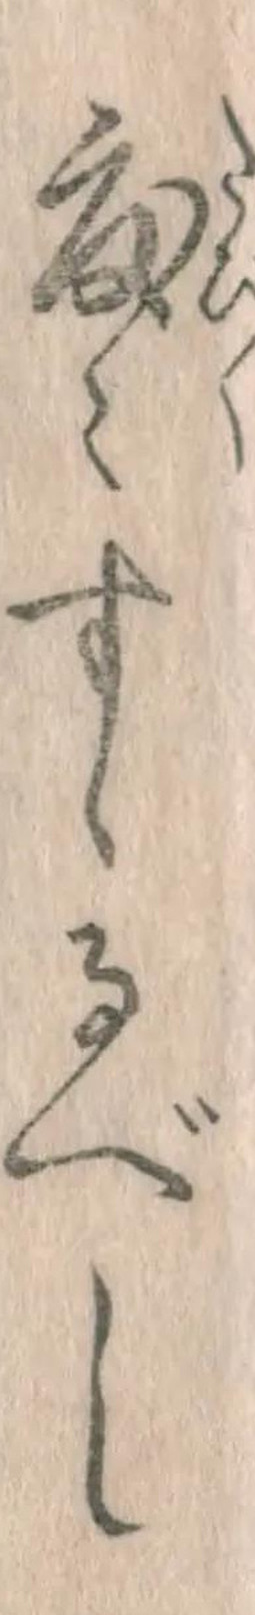度々すゝるべし
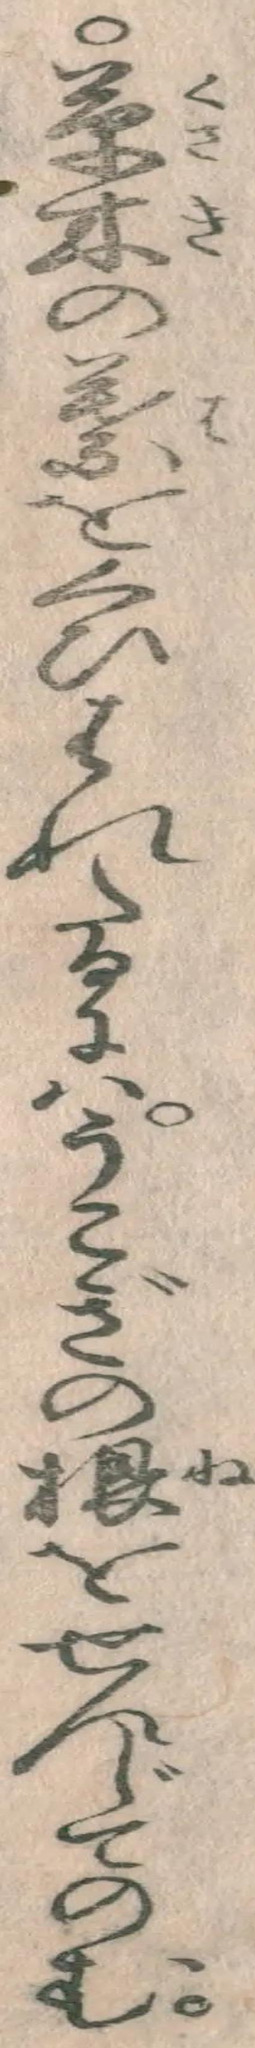◦草木の葉をくひはれたるには。うこぎの根をせんじてのむ。
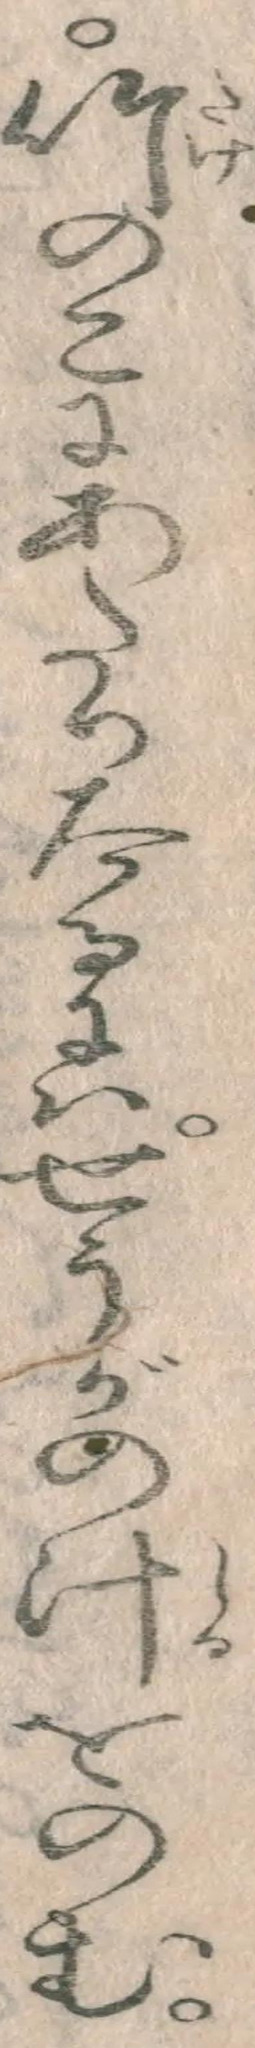◦竹のこにあたりたるには。せうがの汁をのむ。
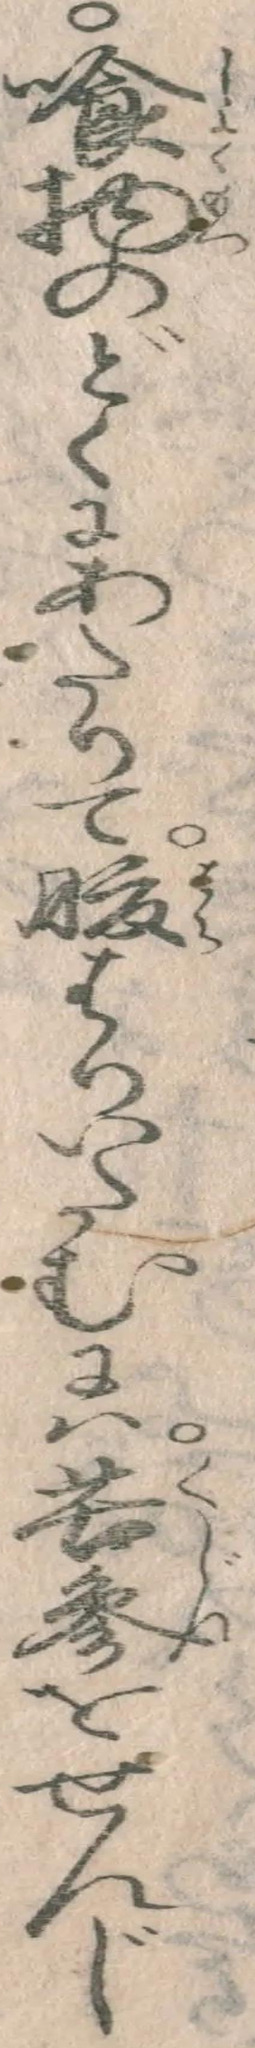◦喰物のどくにあたりて。腹はりいたむには。苦参をせんじ
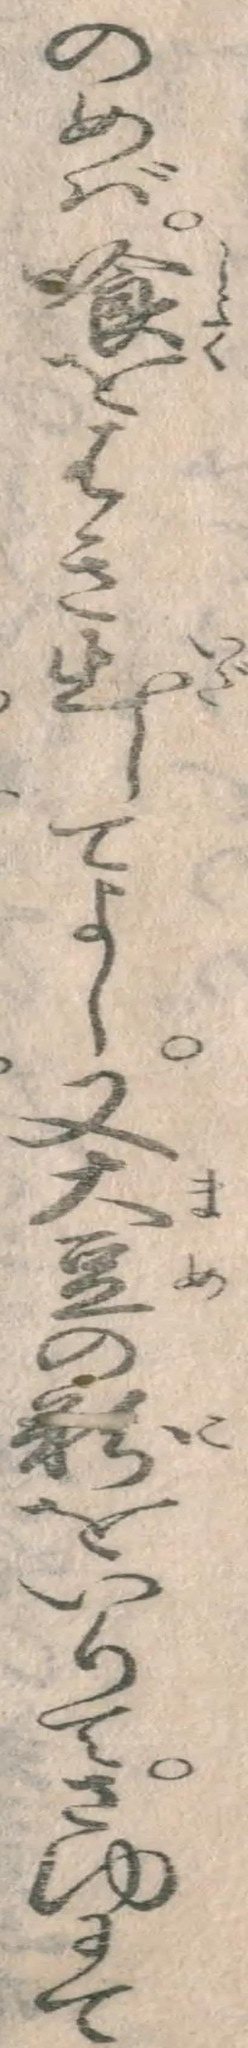のめば。喰をはき出してよし。又大豆の粉をいりて。さゆにて
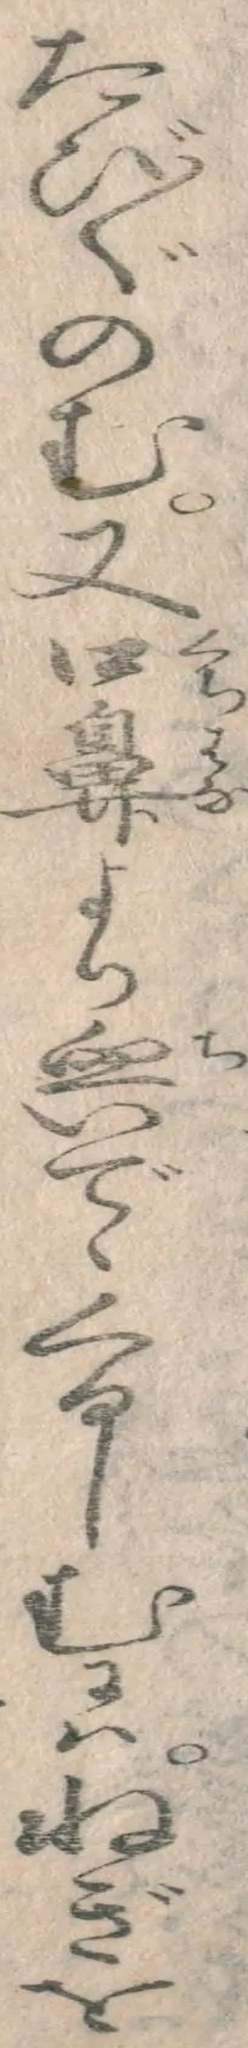たび〴〵のむ。又口鼻より血いでゝくるしむには。ねぎを
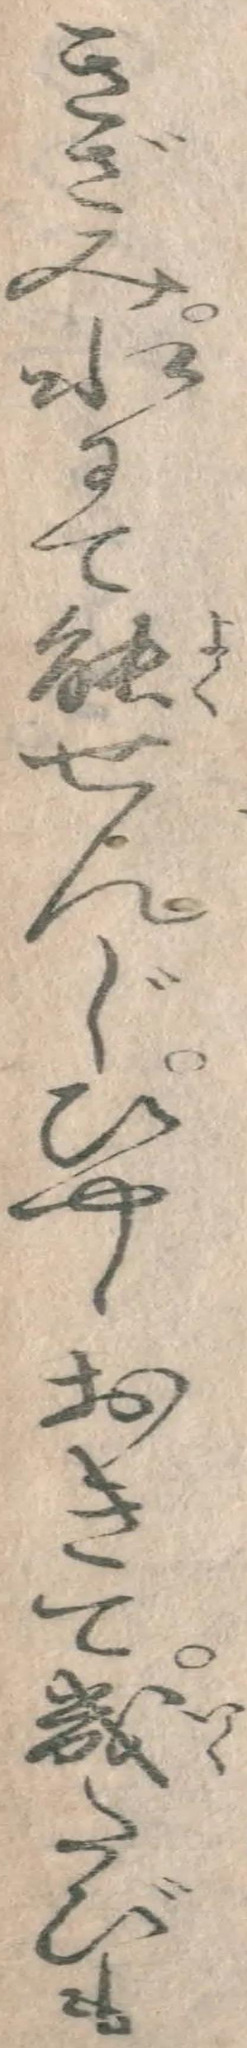きざみ。水にて能せんじ。ひやしおきて。幾たびも
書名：きゝん年の食物
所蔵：国立国会図書館 National Diet Library, JAPAN
